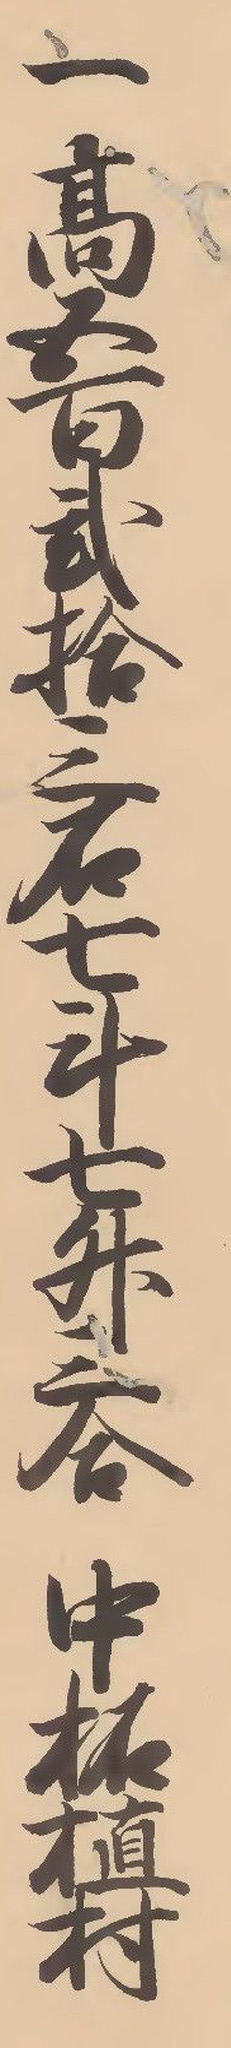一高五百弐拾三石七斗七升三合中柘植村

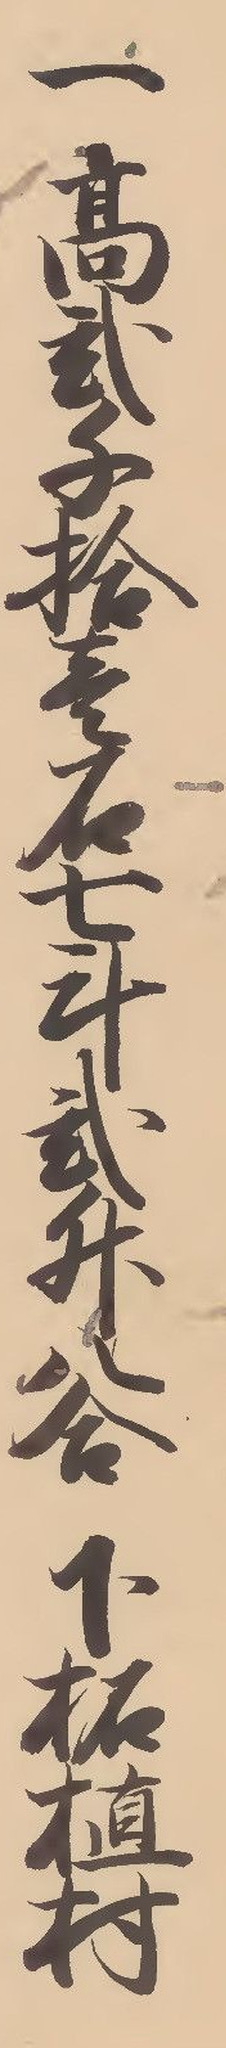一高弐千拾壱石七斗弐升八合下柘植村
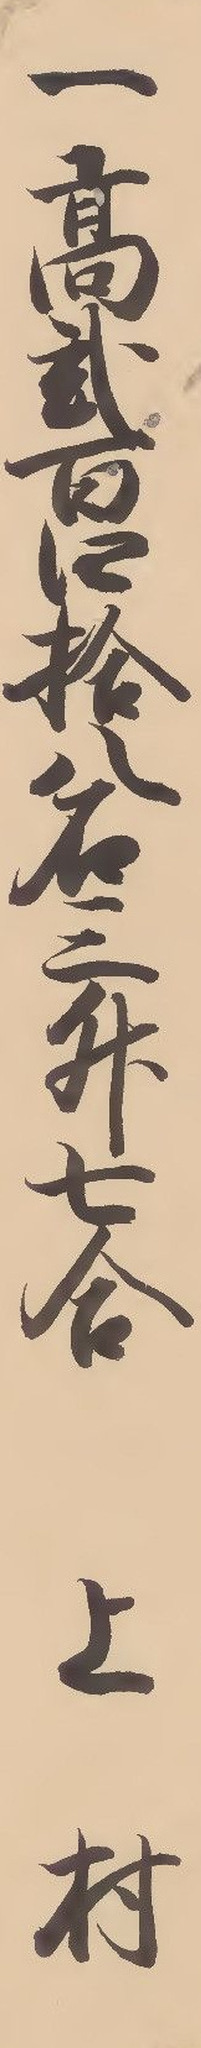一高弐百四拾八石三升七合上村
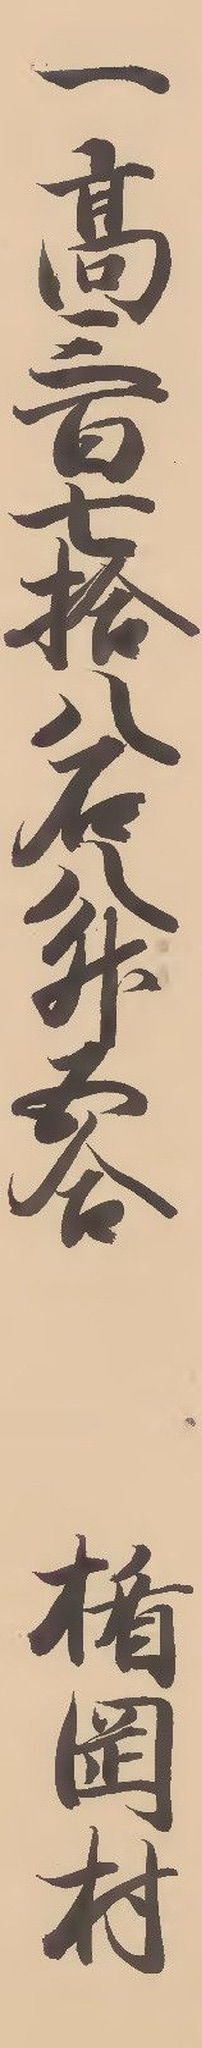一高三百七拾八石八升五合楯岡村
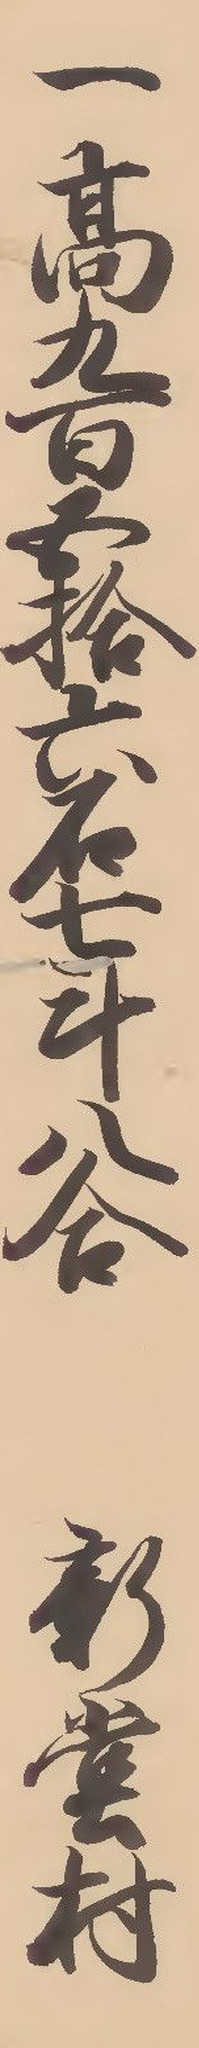一高九百五拾六石七斗八合新堂村
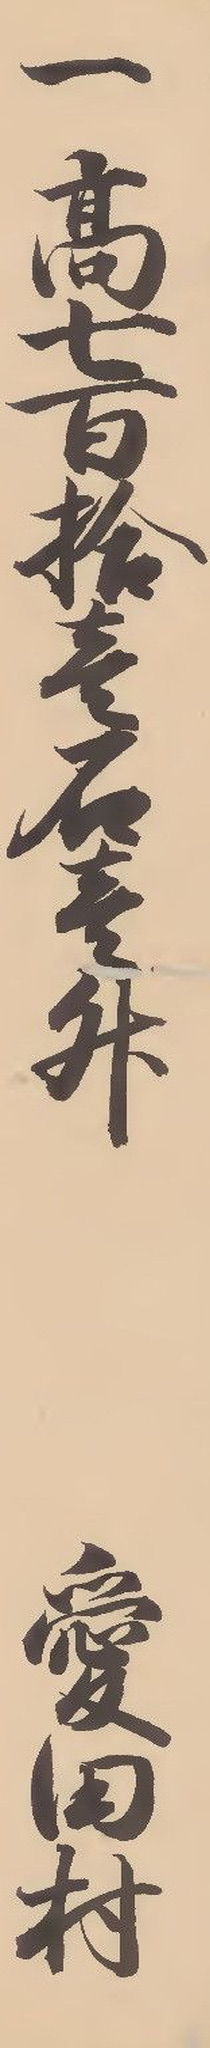一高七百拾壱石壱升愛田村
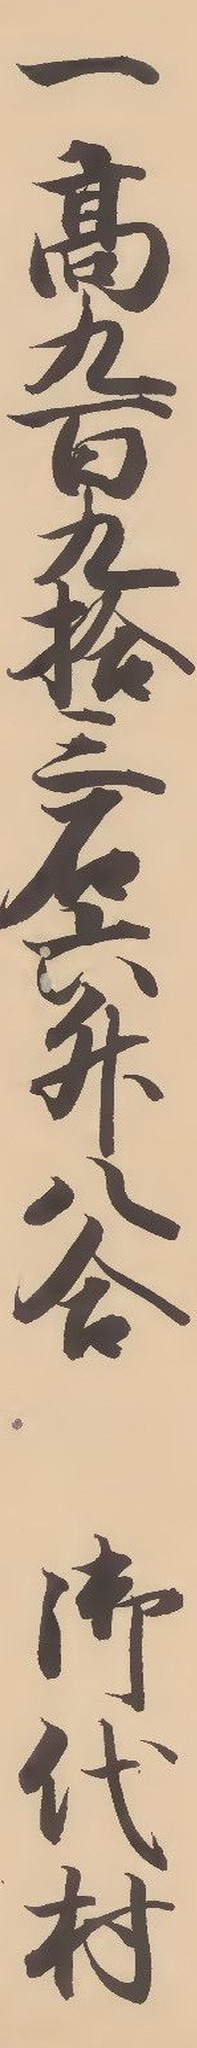一高九百九拾三石六升八合御代村
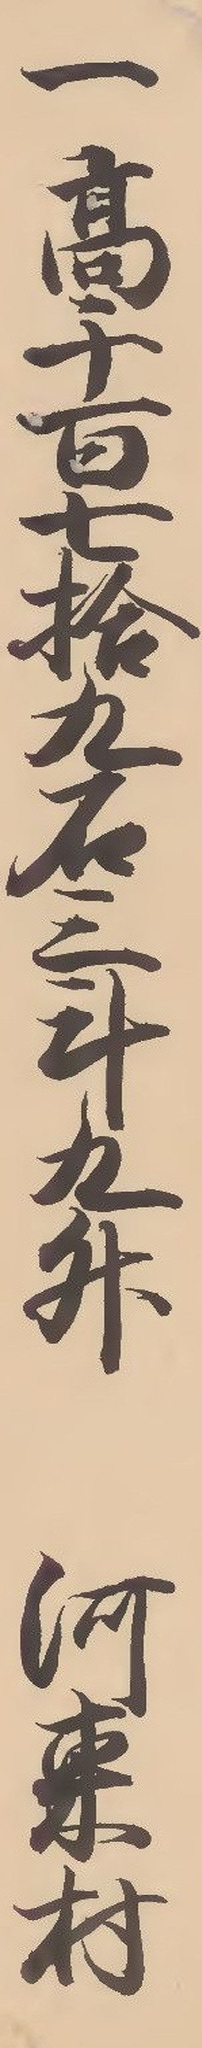一高千百七拾九石三斗九升河東村
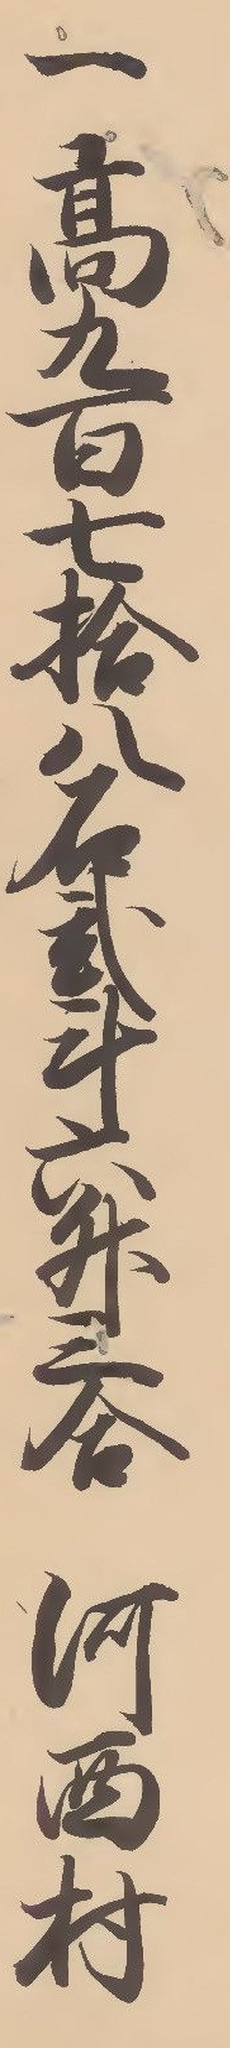一高九百七拾八石弐斗六升三合河西村

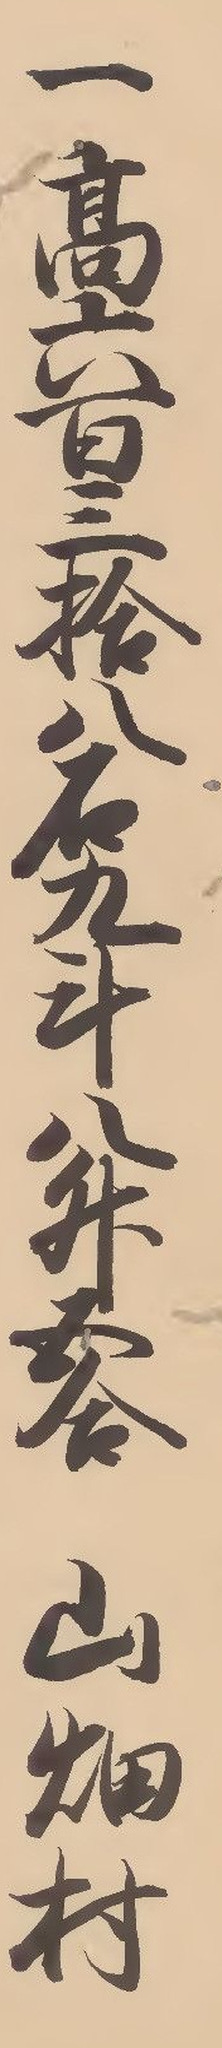一高六百三拾八石九斗八升五合山畑村
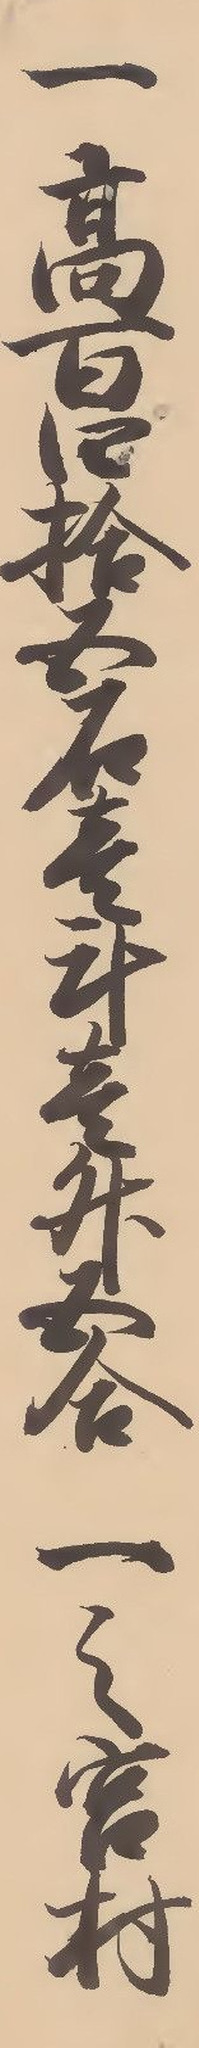一高百四拾五石壱斗壱升五合一之宮村
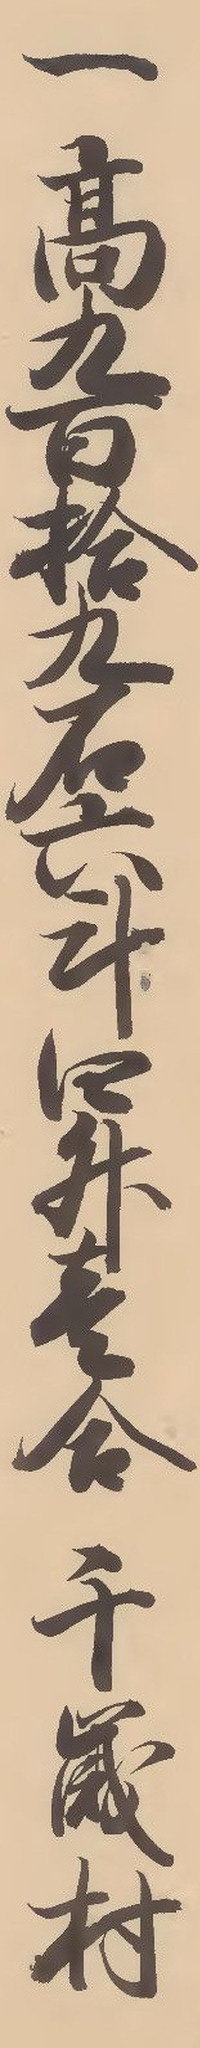一高九百拾九石六斗四升壱合千歳村
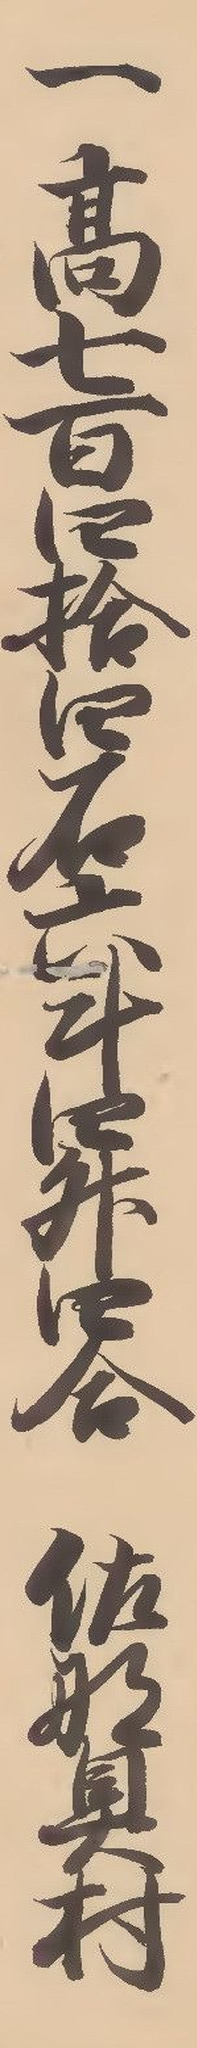一高七百四拾四石六斗四升四合佐那具村
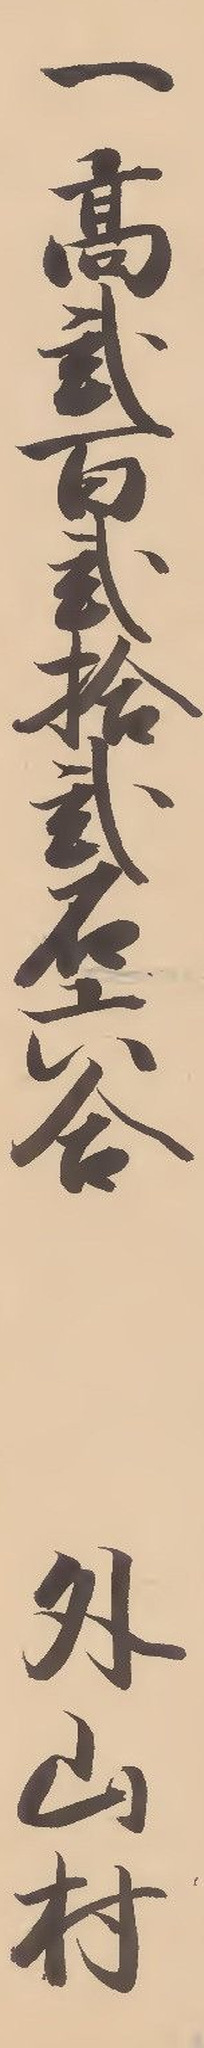一高弐百弐拾弐石六合外山村
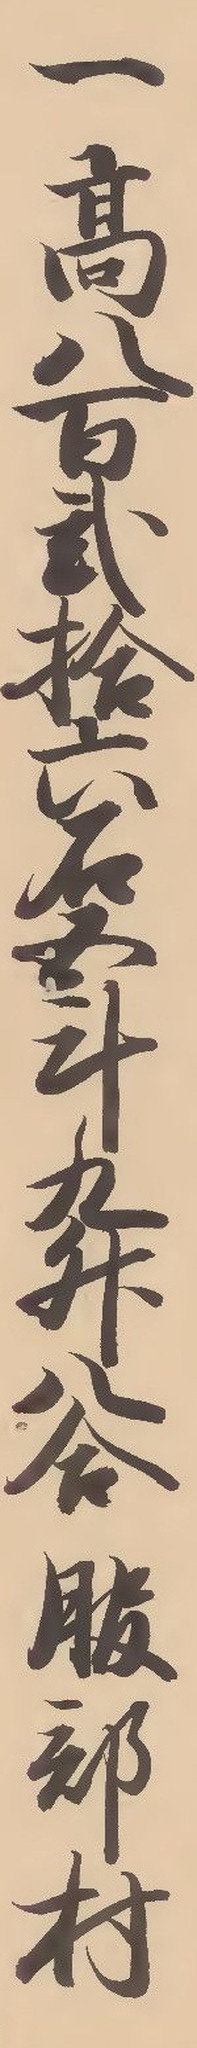一高八百弐拾六石五斗九升八合服部村
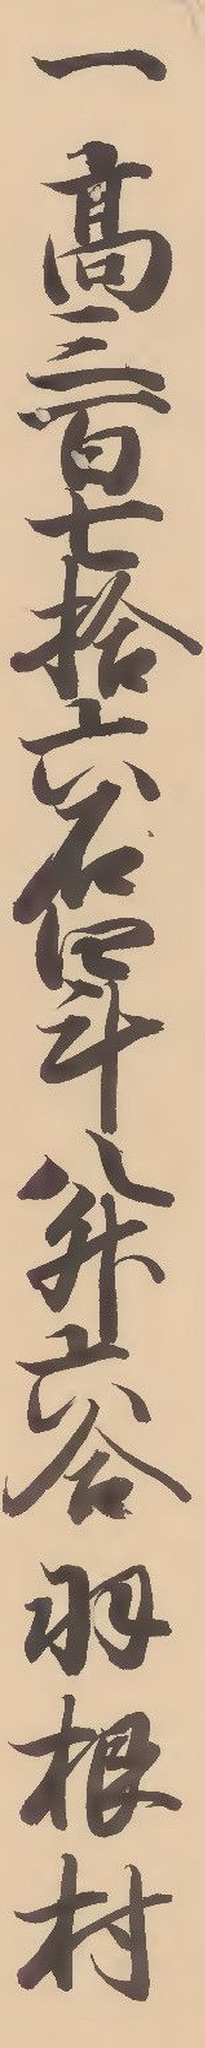一高三百七拾六石四斗八升六合羽根村
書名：伊賀国郷帳
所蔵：国立公文書館 National Archives of Japan
